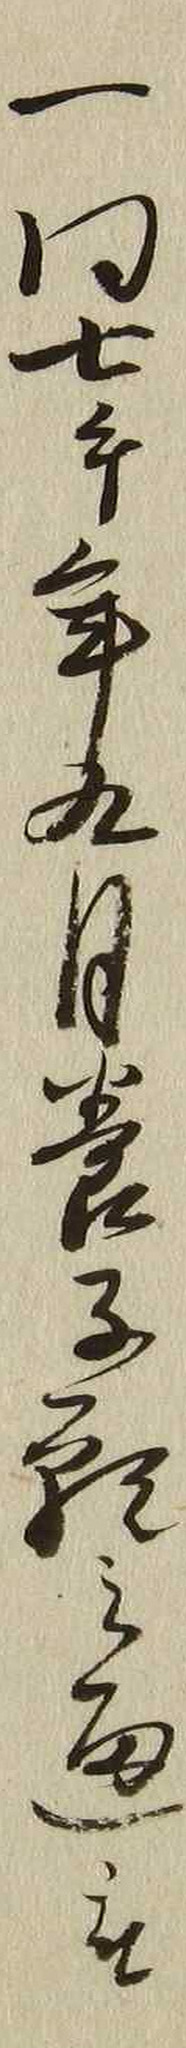一同七午年九月養子願之通被
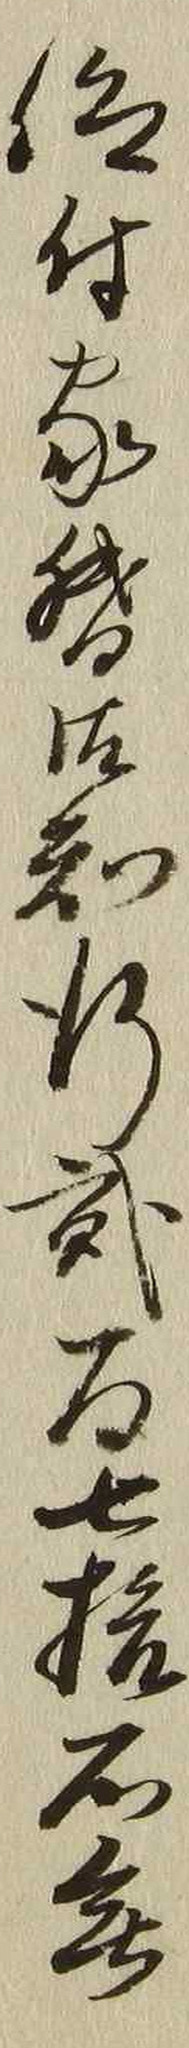仰付家督御知行弐百七拾石無
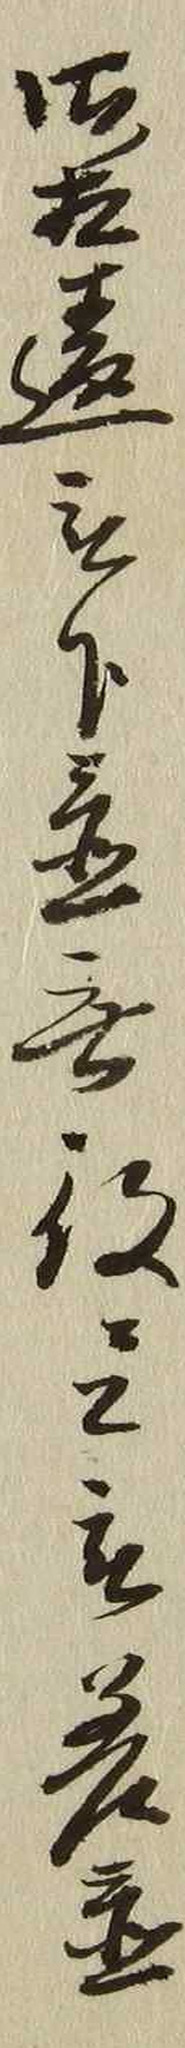御相違被下置無役にて被差置
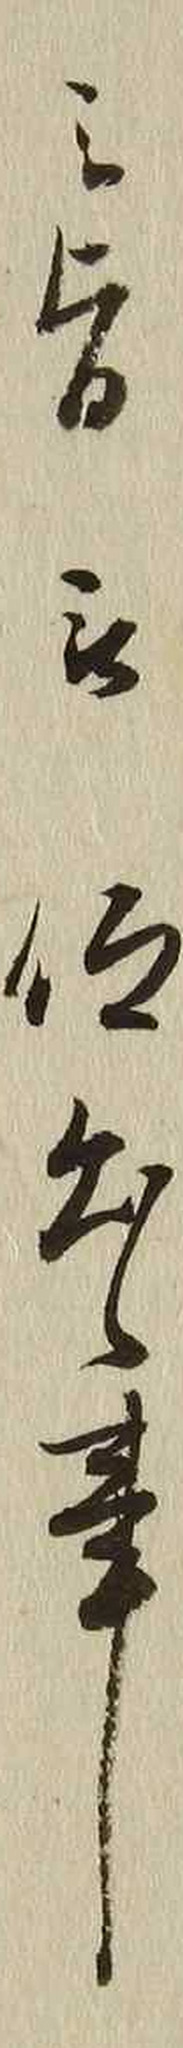之旨被仰出候事
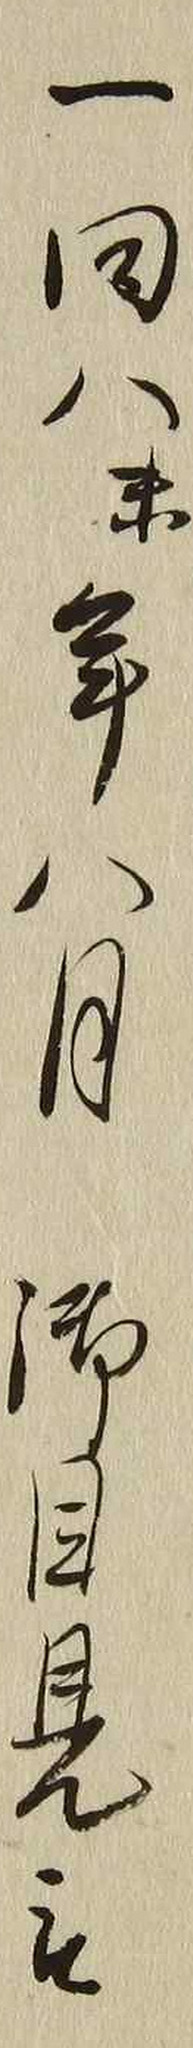一同八未年八月御目見被
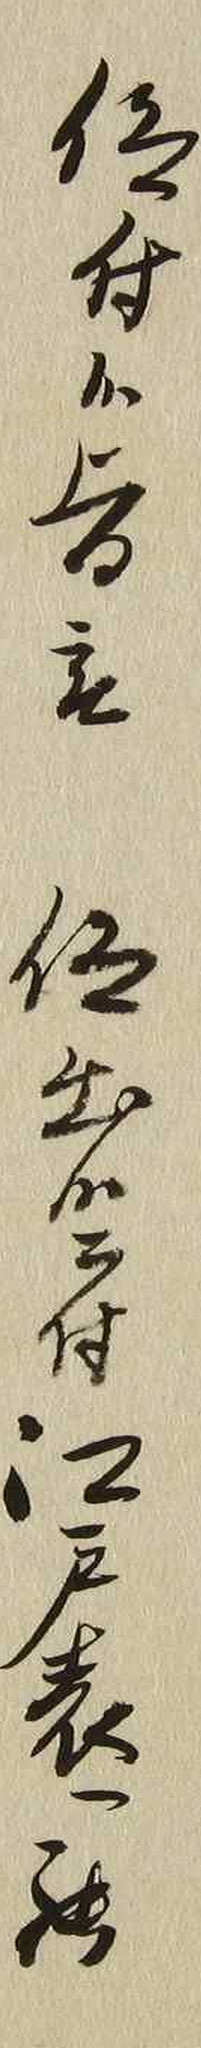仰付候旨被仰出候ニ付江戸表へ罷
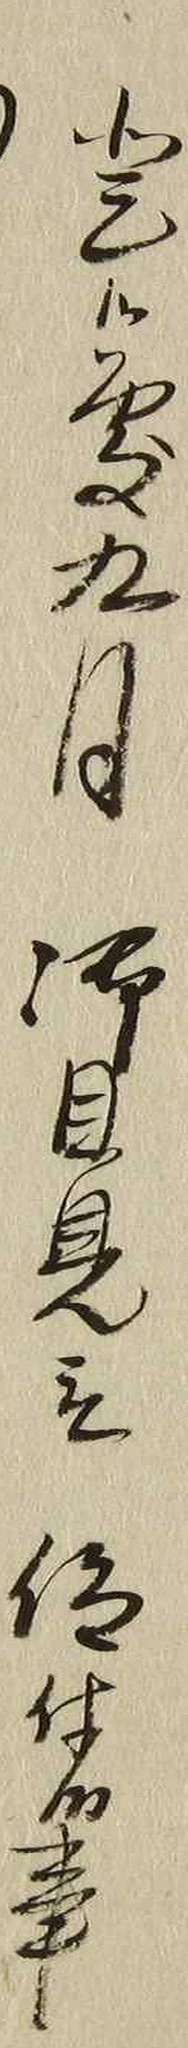登候処九月御目見被仰付候事
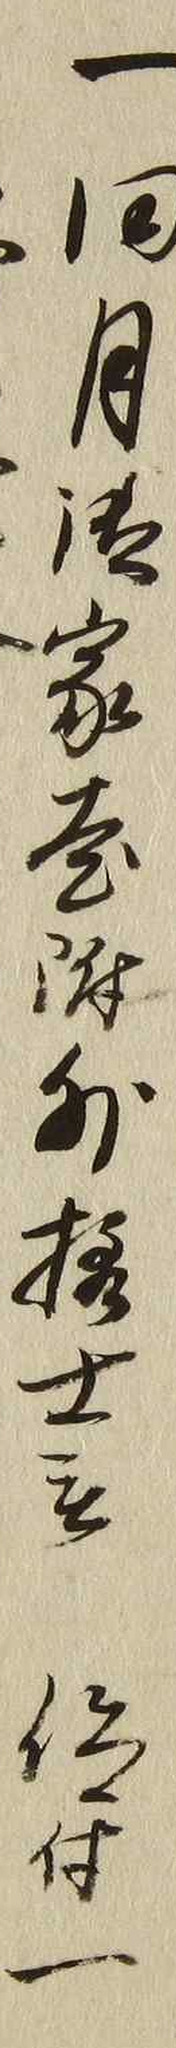一同月御家老附外様士被仰付一
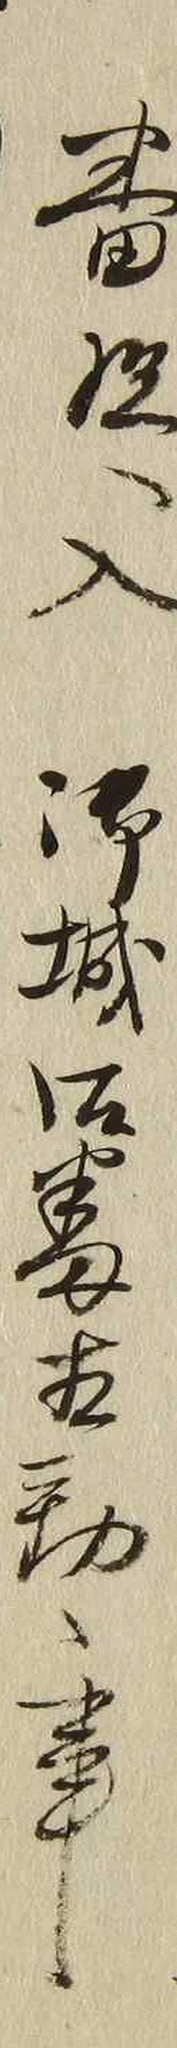番組へ入御城御番相勤候事
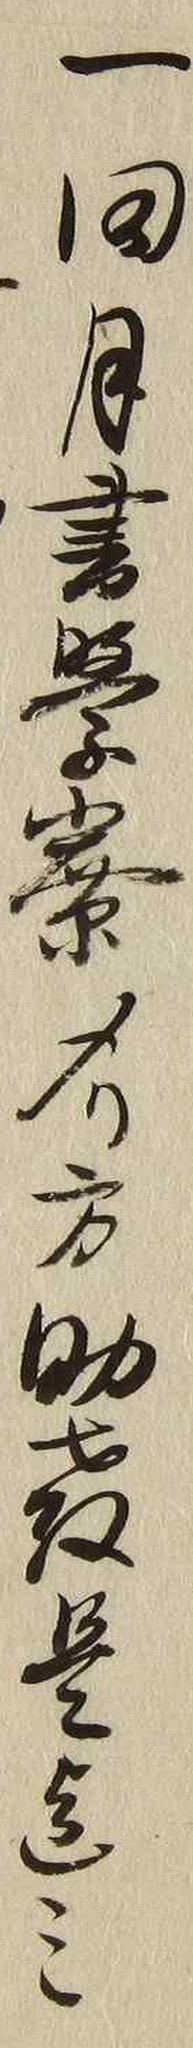一同月書学寮〆り方助教是迄之
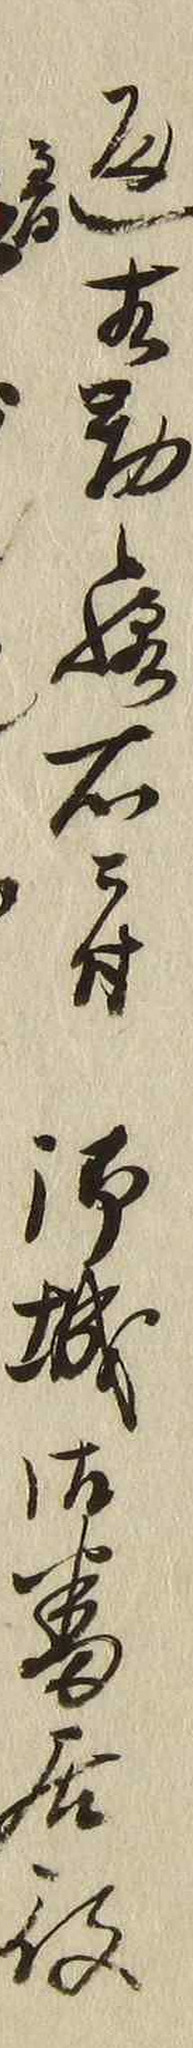通相勤候様右ニ付御城御番居役
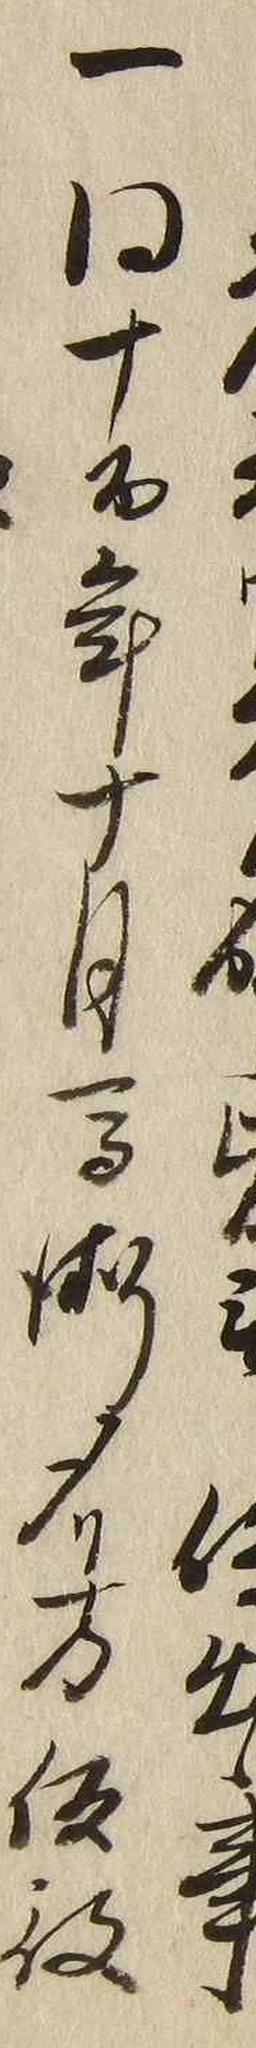一同十酉年十月馬術〆リ方仮役
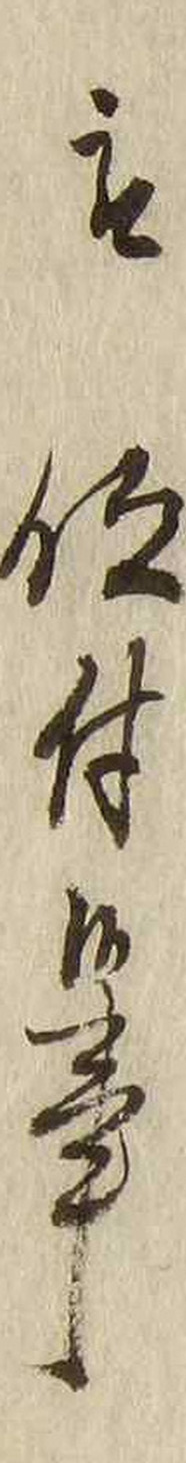被仰付候事

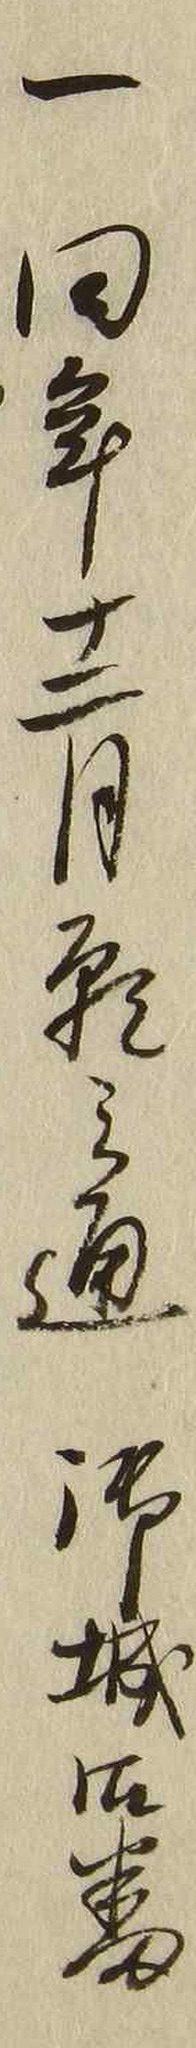一同年十二月願之通御城御番
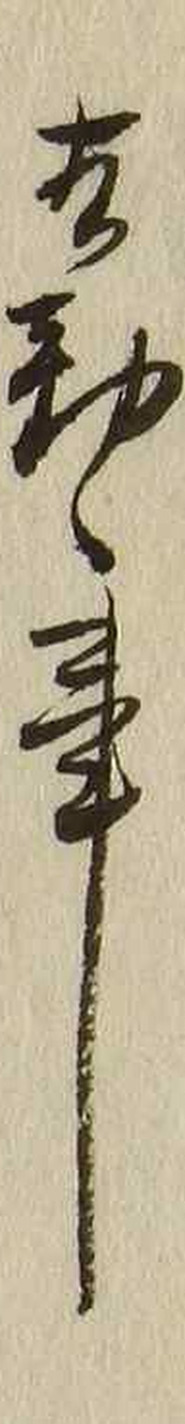相勤候事
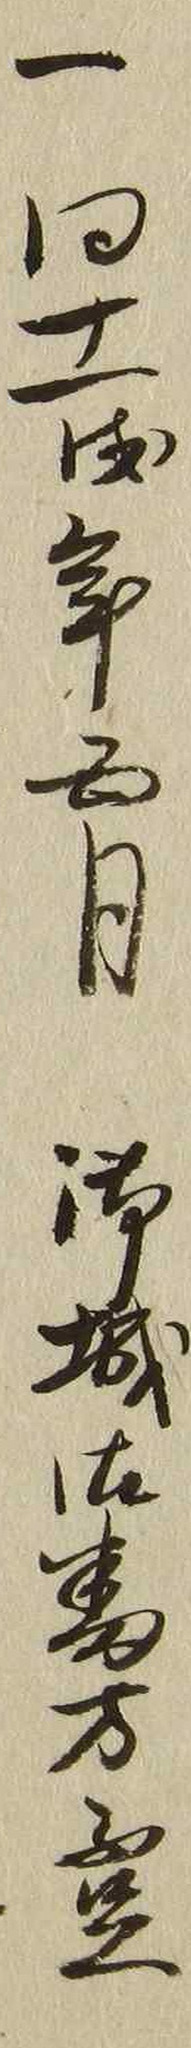一同十一戌年五月御城御番方不足
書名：諸士系譜　巻之348　も之部4
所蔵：会津若松市立会津図書館
